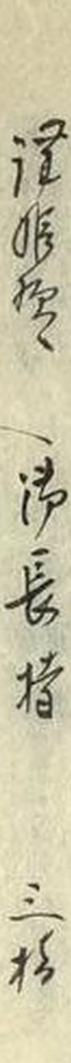謹姫様へ御長持三指
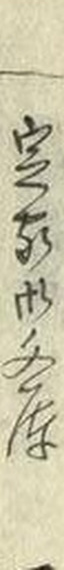定家御文庫一
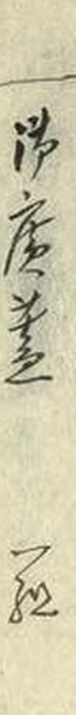御広蓋一組
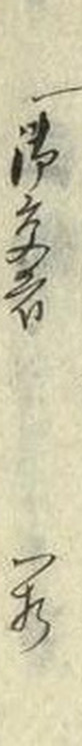御交肴一折
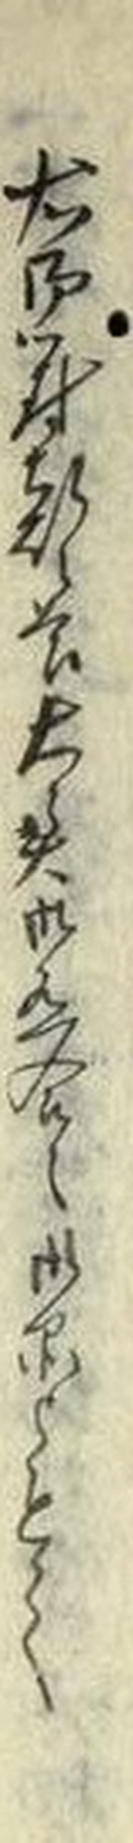右御対顔之節大奥御有合之御品被進之

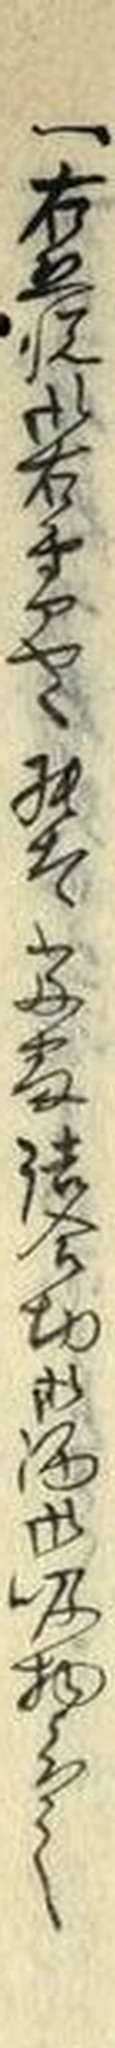一右恐悦御右筆部屋へ罷出候当番詰合切御酒御吸物被下之
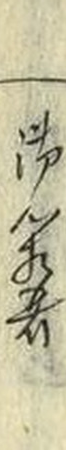御箱肴一
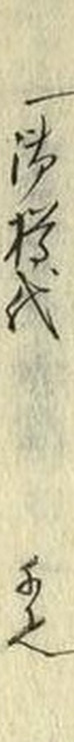御樽代千疋
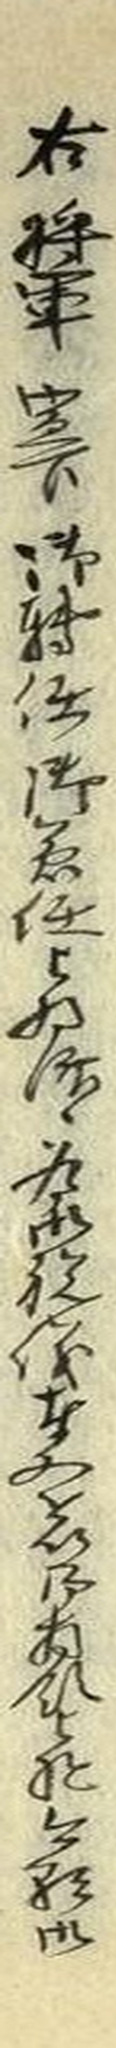右将軍宣下御転任御兼任被為済候為御祝儀奉文を以御拝領被遊今朝御
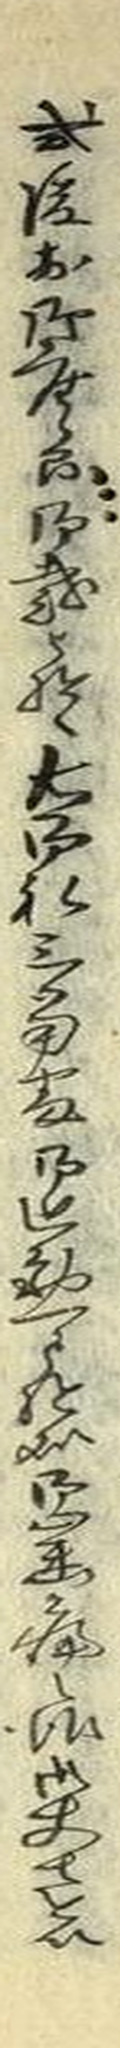式後於御座之間御戴被遊候右御礼三御用番御廻勤可被遊処御歯痛之趣御使を以
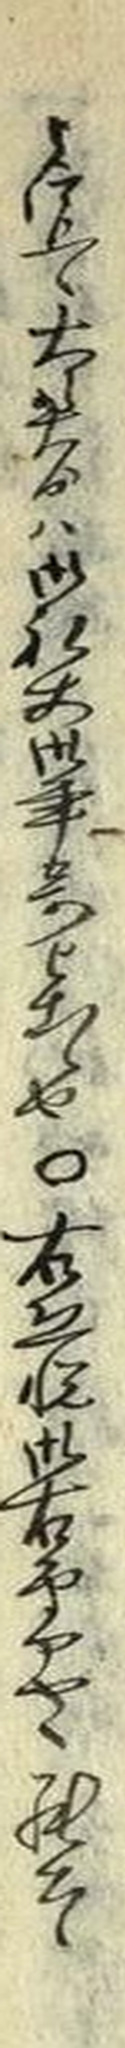被仰上候大奥ゟハ御礼使御年寄被出候由〇右恐悦御右筆部屋へ罷出候
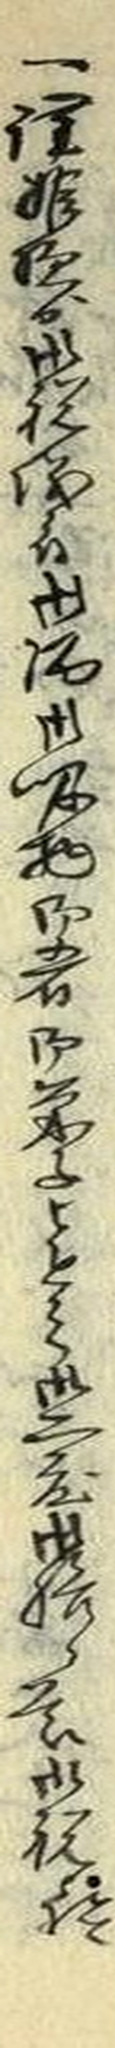一謹姫様ゟ御祝儀ニ付御酒御吸物御肴御菓子被進之御二度御膳之節御祝被遊候
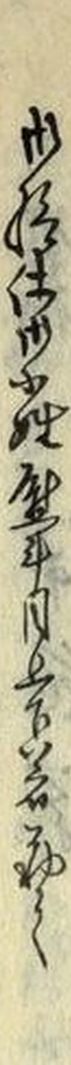御給仕御小姓熨斗目上下着勤之
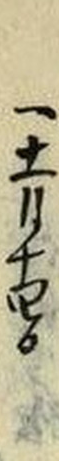一十一月十四日
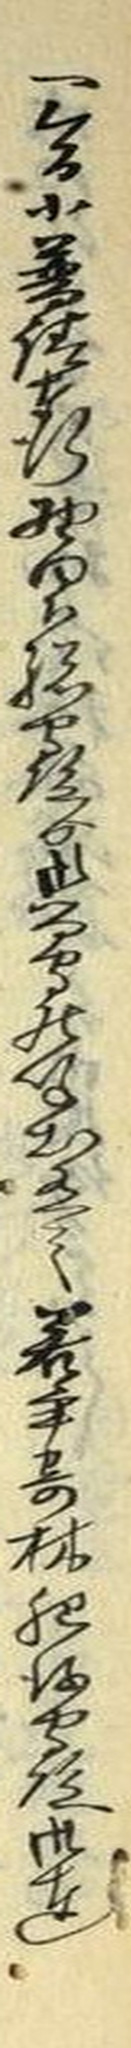一今日小普請奉行野田下総守殿ゟ御留守居呼出有之若年寄林肥後守殿御達
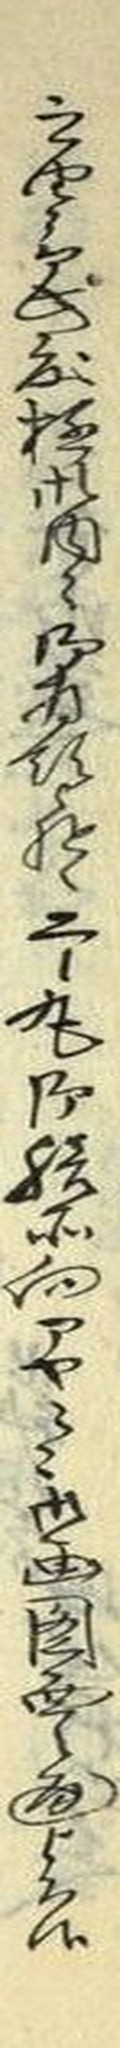之由ニ而此度極御内々御拝領被遊候二ノ丸御膳所向部屋々々御画図面之通被下候
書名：少傅日録抄（斉善付側向頭取日記、在府）
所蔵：福井県文書館 Fukui Prefectural Archives
